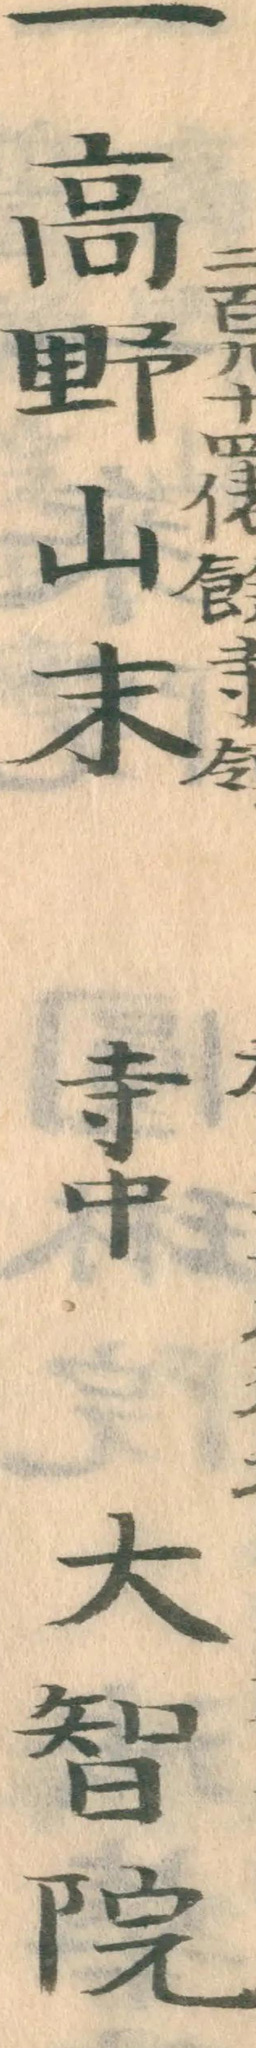一高野山未寺中大智院
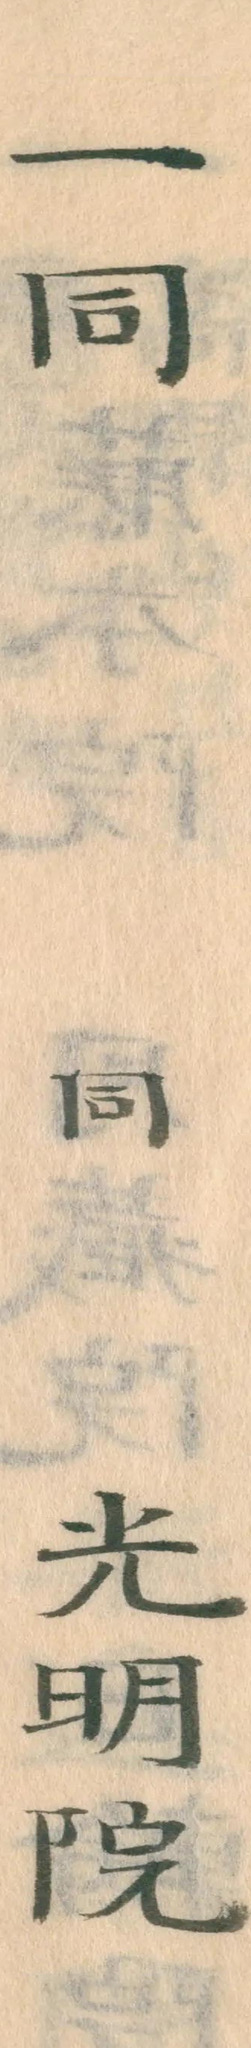一同同光明院
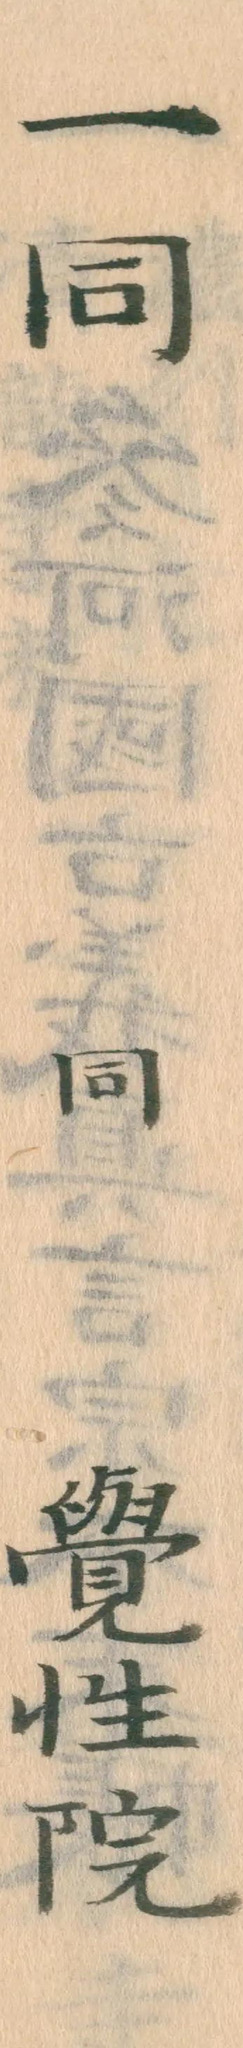一同同覚性院
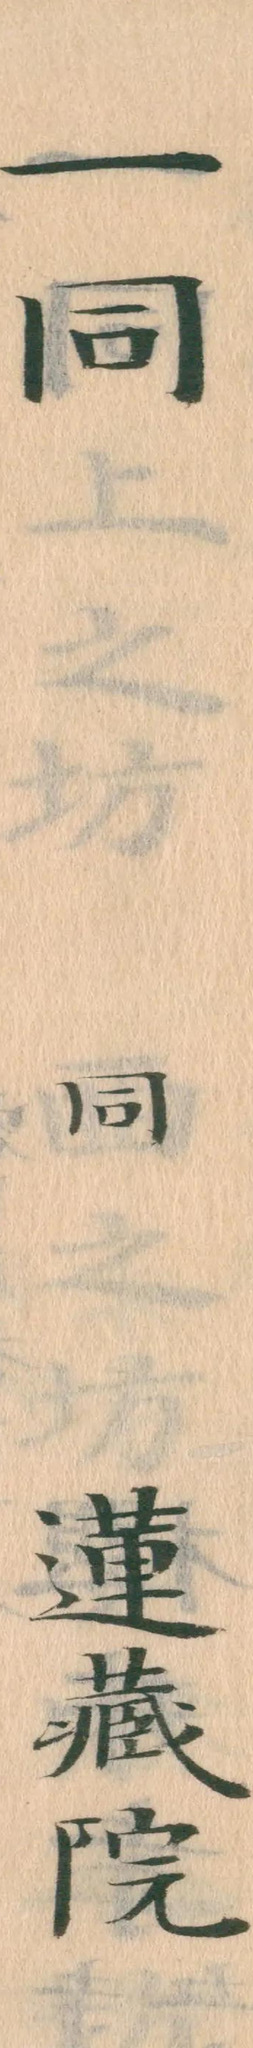一同同蓮蔵院
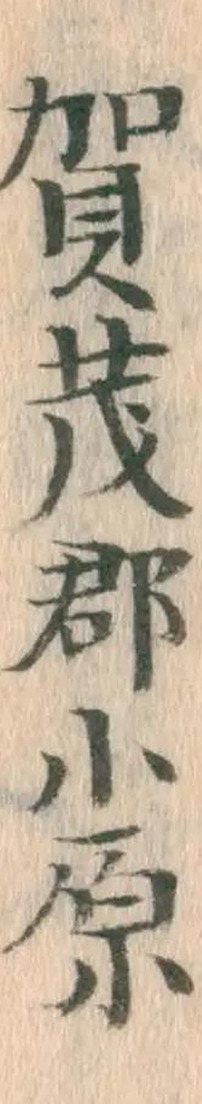加茂郡小原
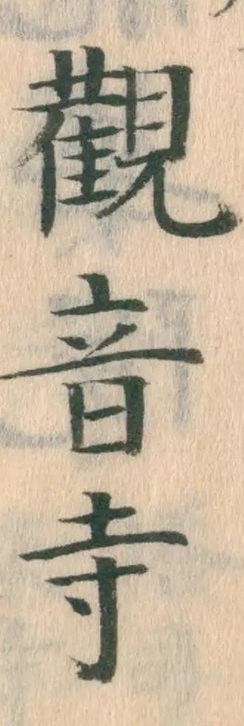観音寺

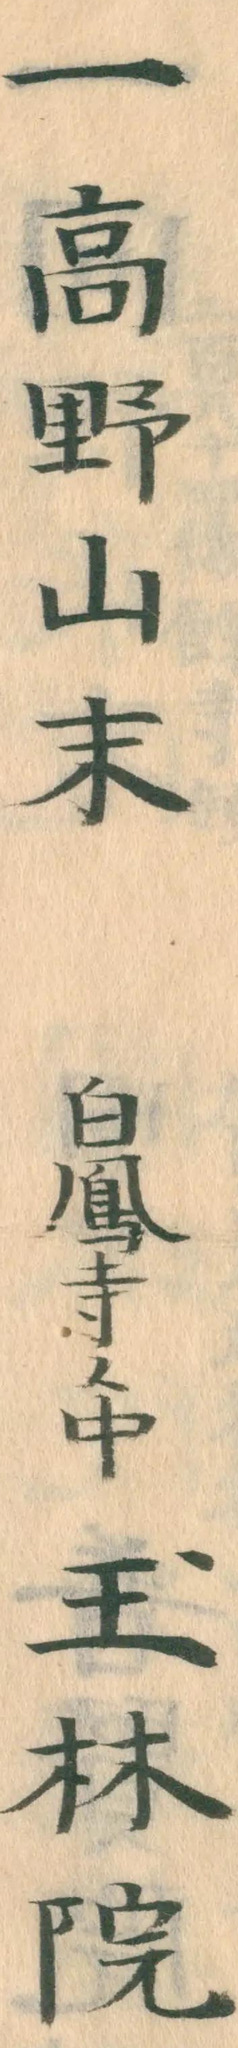一高野山未白鳳寺之中王林院
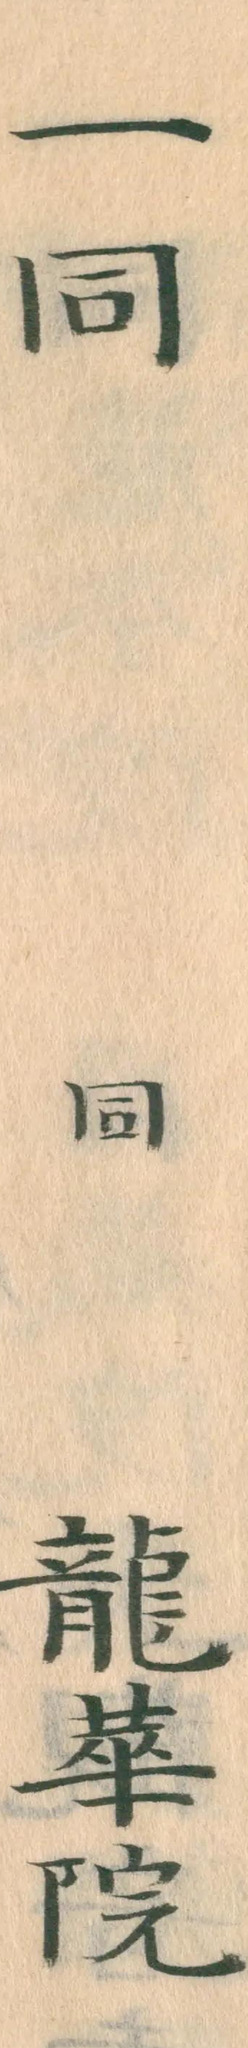一同同龍華院
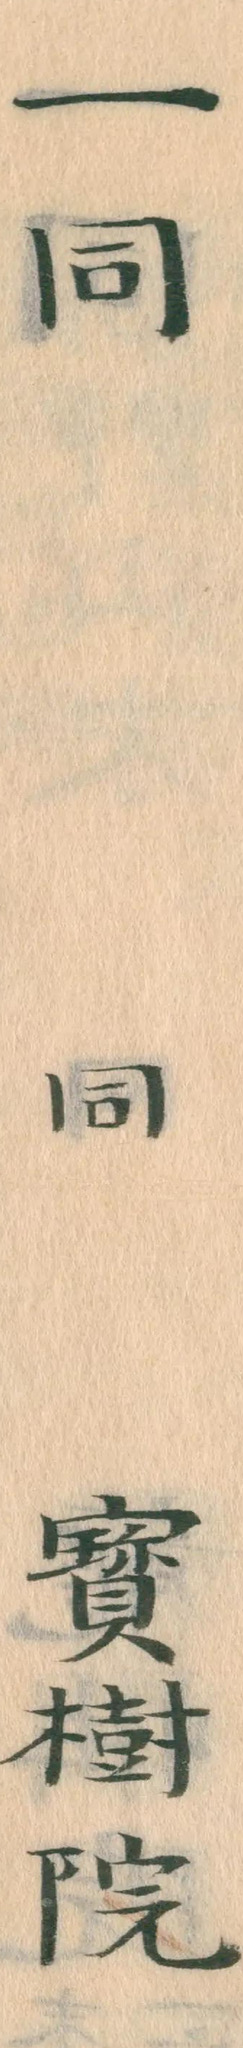一同同寶樹院
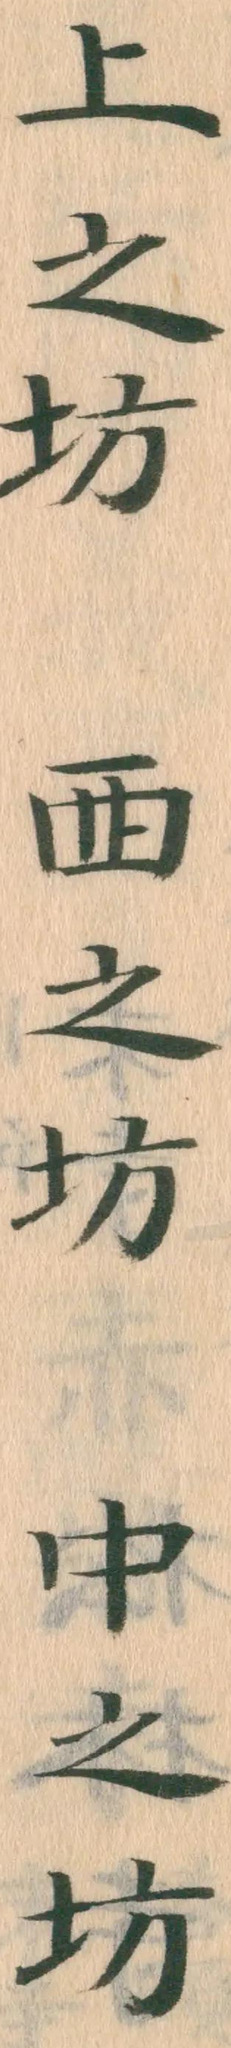上之坊西之坊中之坊
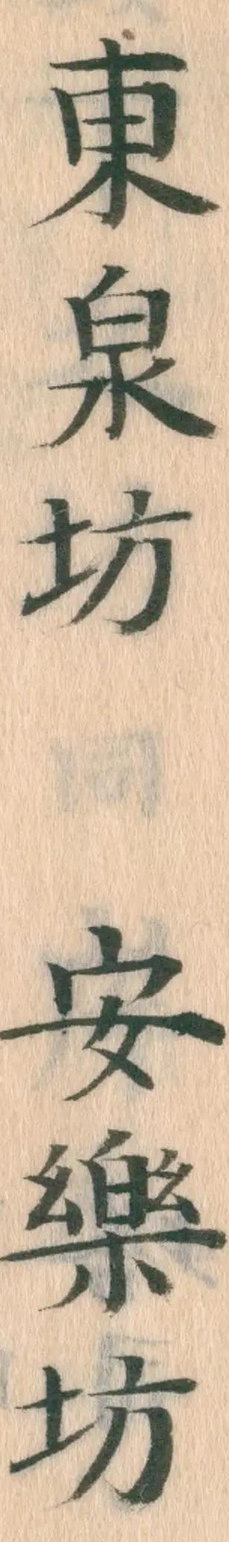東泉坊安楽坊

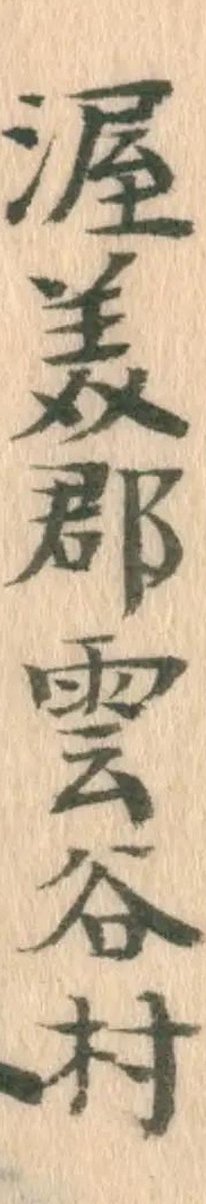渥美郡牟呂村
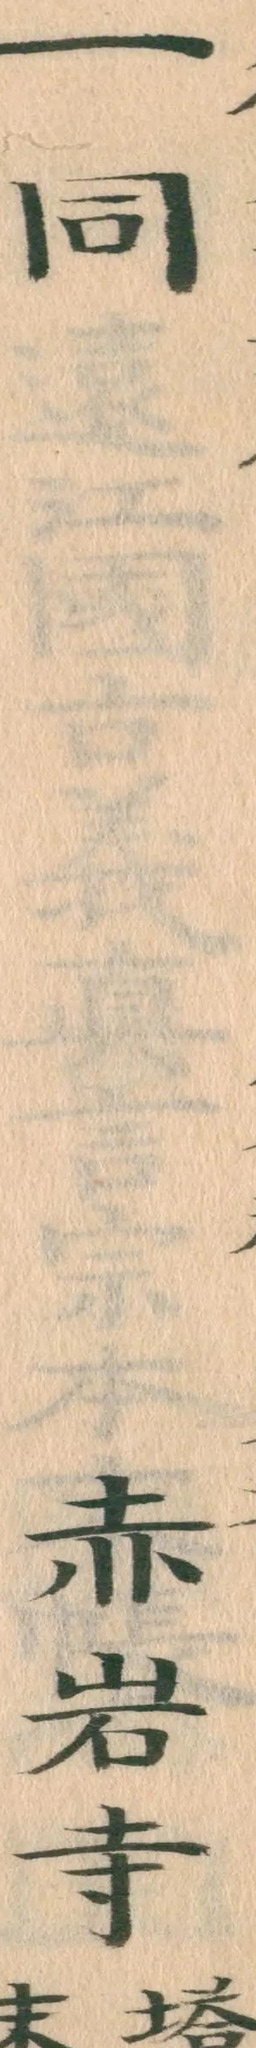一同赤岩寺
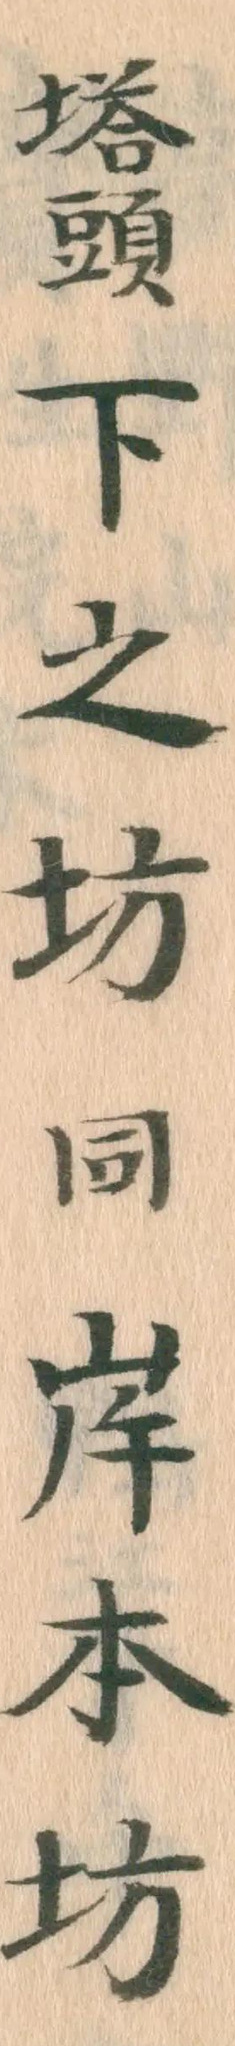塔頭下之坊同岸本坊
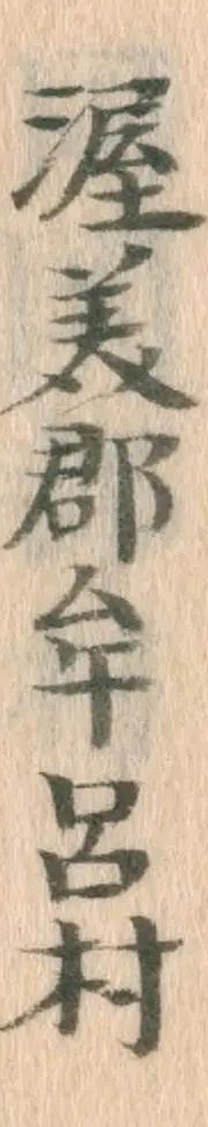渥美郡牟呂村
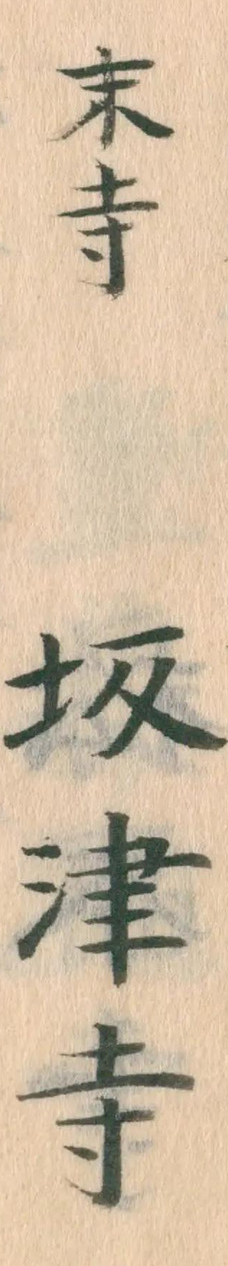未寺坂津寺
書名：古義真言宗本末帳 21巻. [4] 第三 伊賀国、伊勢国、志摩国、尾張国、三河国、遠江国、駿河国、伊豆国、甲斐国
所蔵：国立国会図書館 National Diet Library, JAPAN
